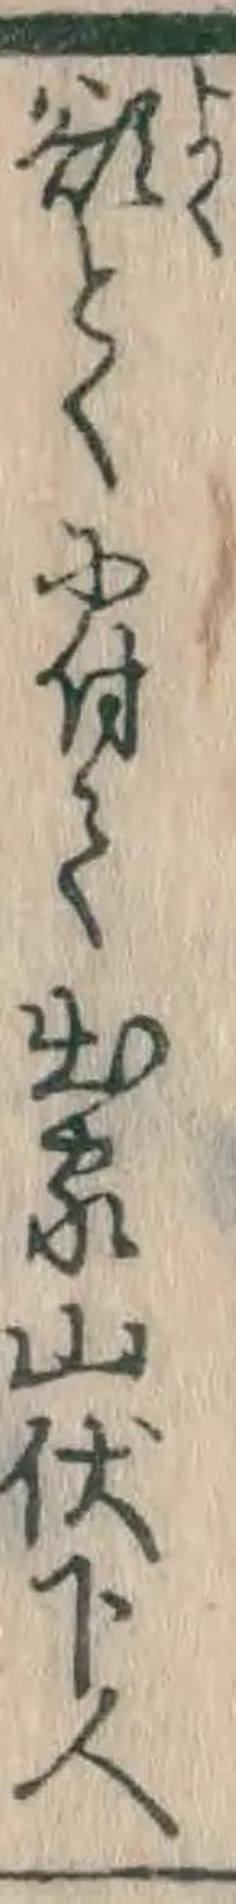欲とくに付て出家山伏下人
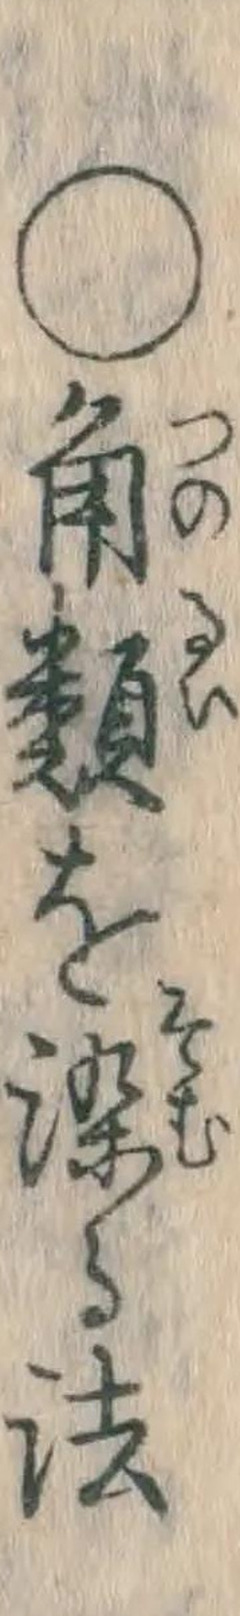○角類を染る法
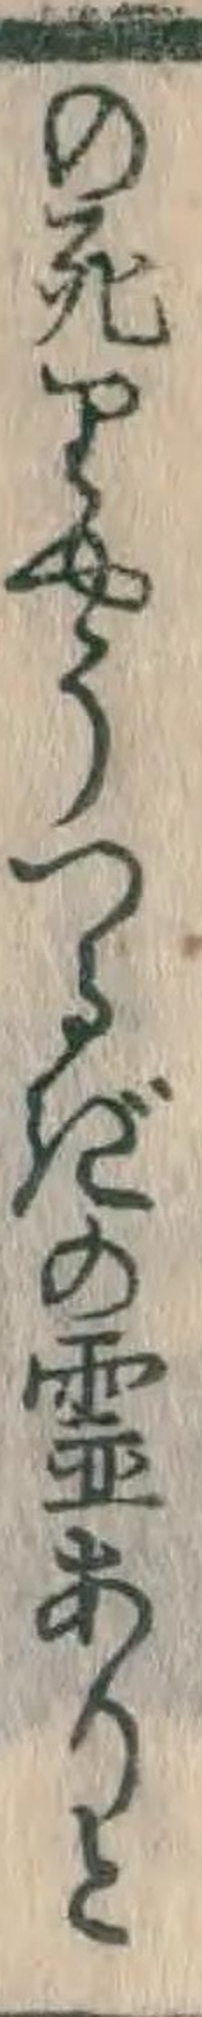の死りやうつるぎの霊ありと
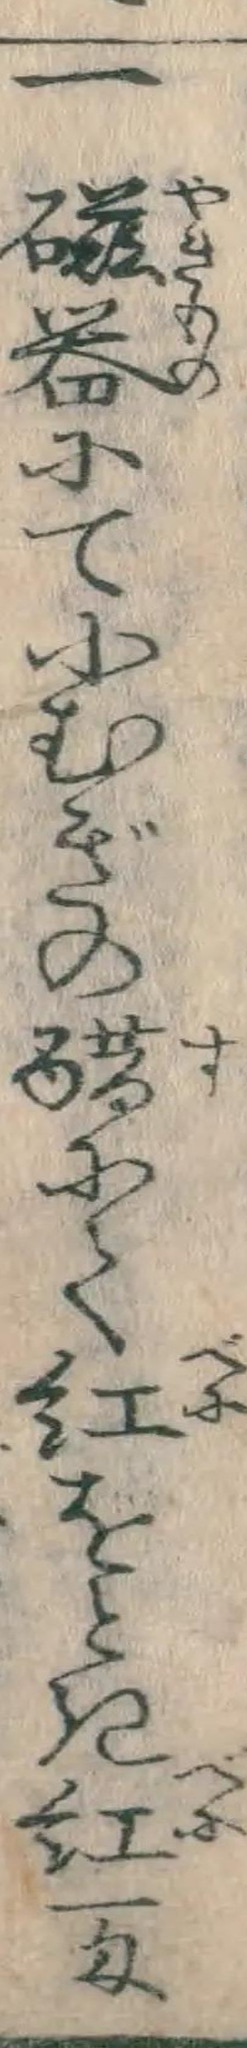一磁器にて小むぎの醋にて紅をとき紅一匁
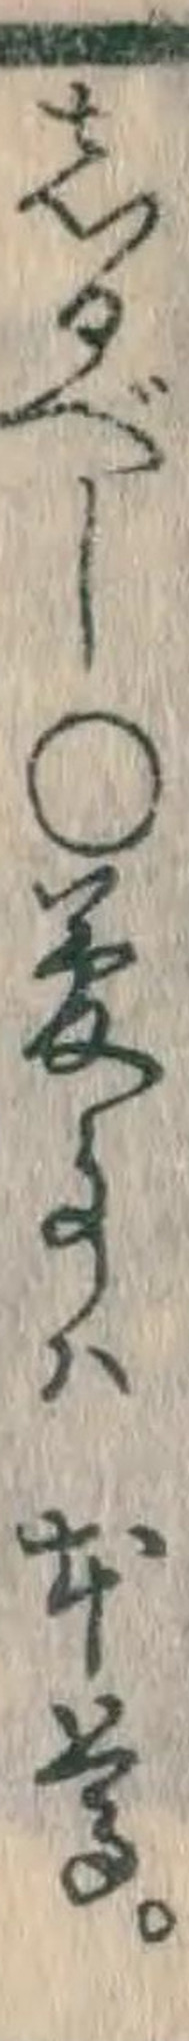しるべし○夢事は本尊。
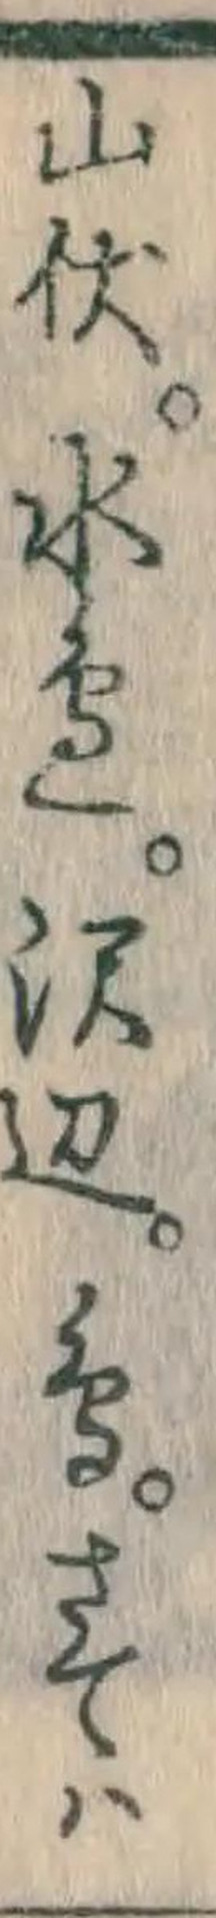山伏。水辺。沢辺。鳥。さては
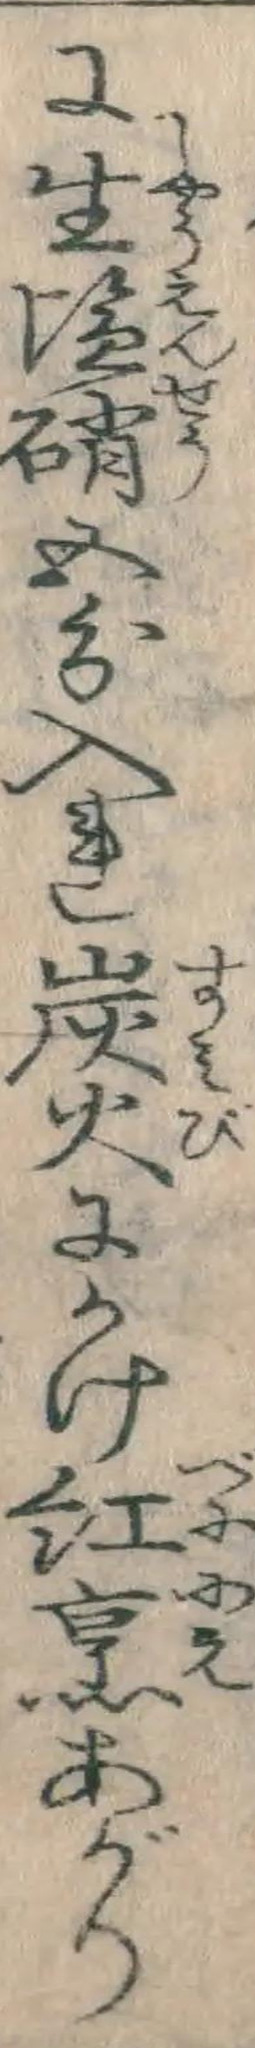に生塩硝五分入れ炭火にかけ紅烹あがり
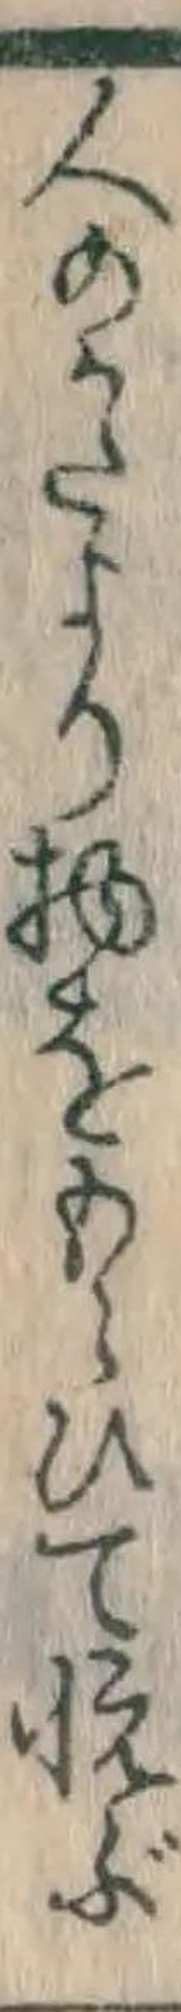人のかたより物をもらひて悦ぶ
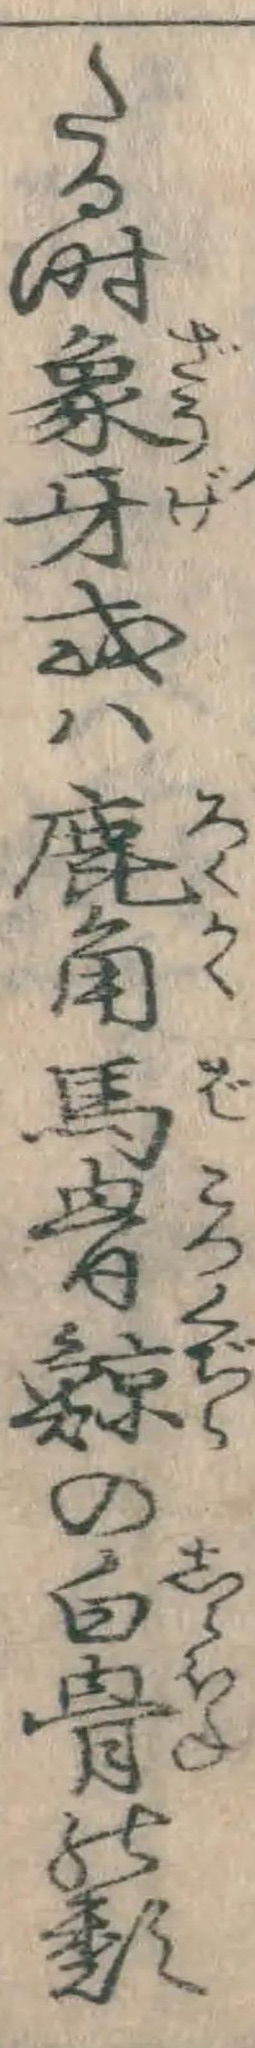たる時象牙或は鹿角馬骨鯨の白骨の類

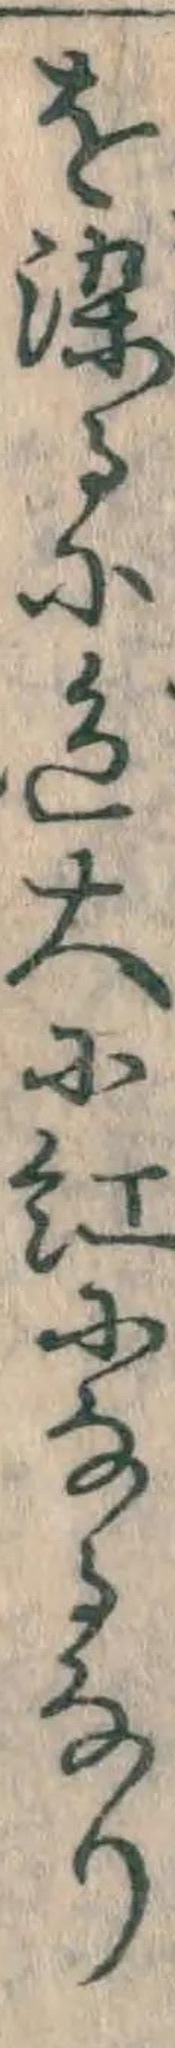を染るに色大に紅になるなり
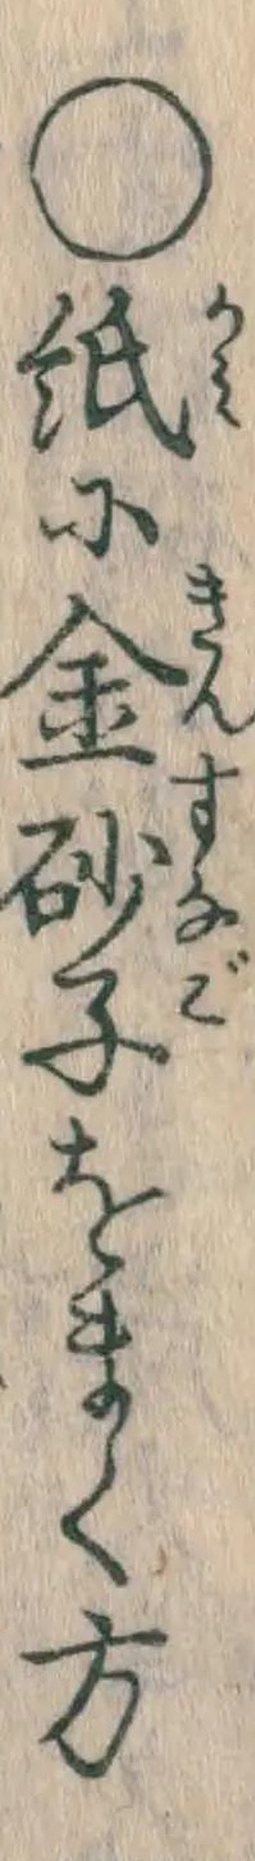○紙に金砂子をまく方
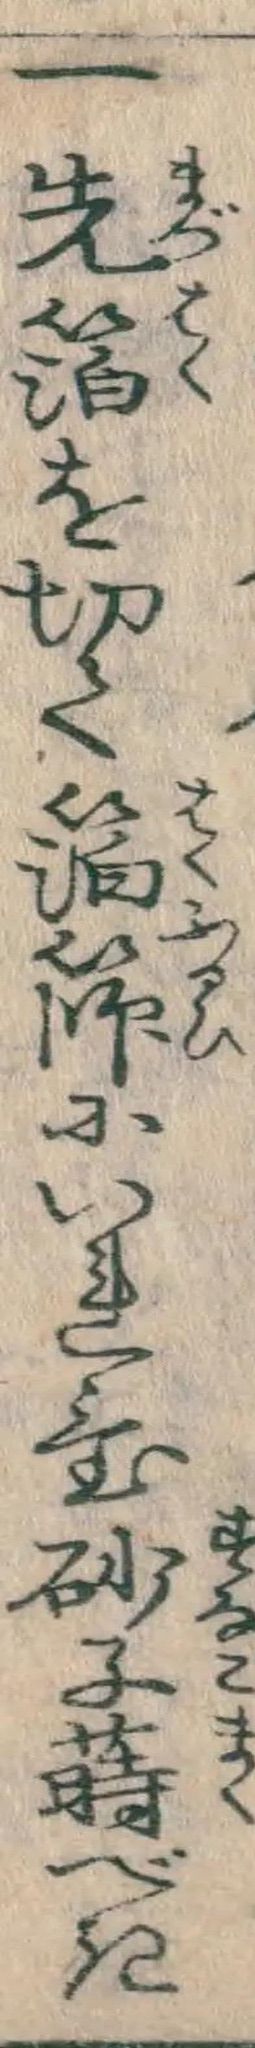一先箔を切て箔篩にいれ置砂子蒔べき
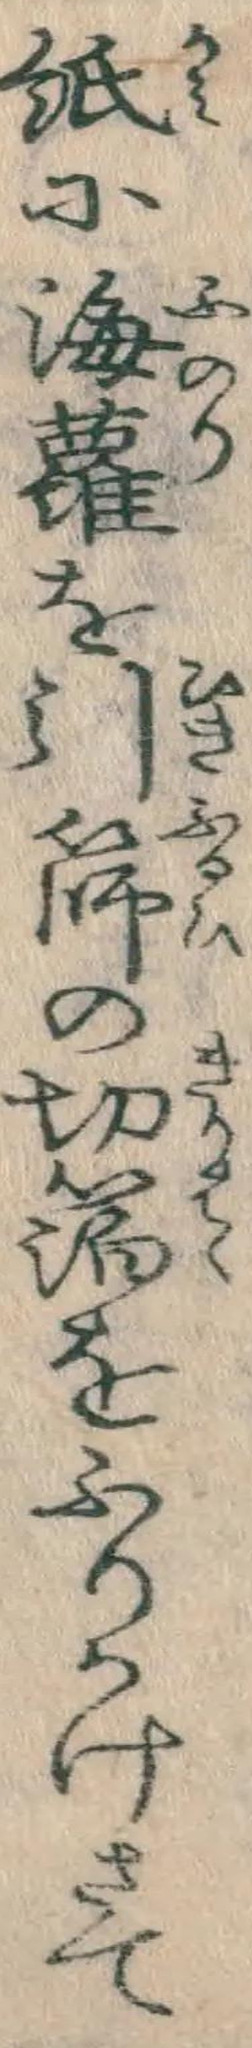紙に海蘿を引篩の切箔をふりかけさて
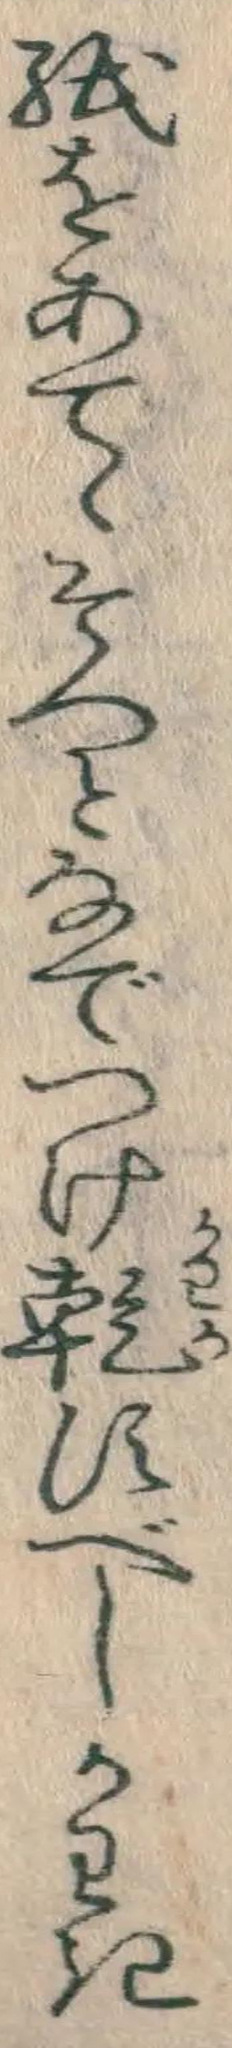紙をあてゝそつとなでつけ乾すべしかわき
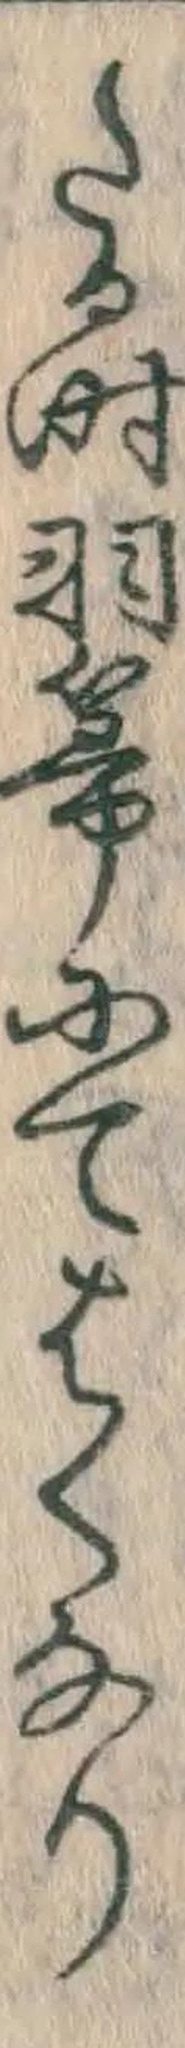たる時羽箒にてはくなり
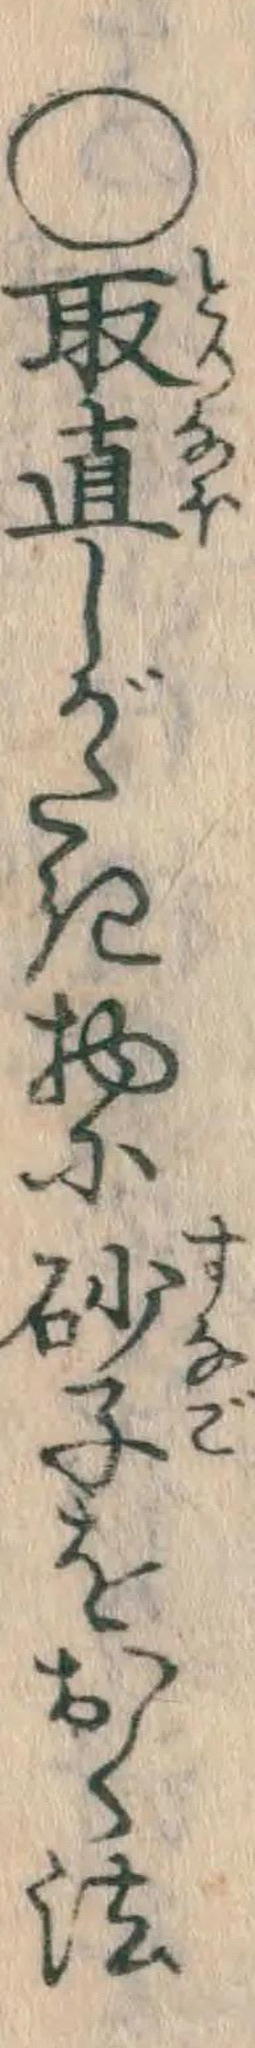○取直しがたき物に砂子をおく法
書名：広益秘事大全 3巻. [1]
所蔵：国立国会図書館 National Diet Library, JAPAN
